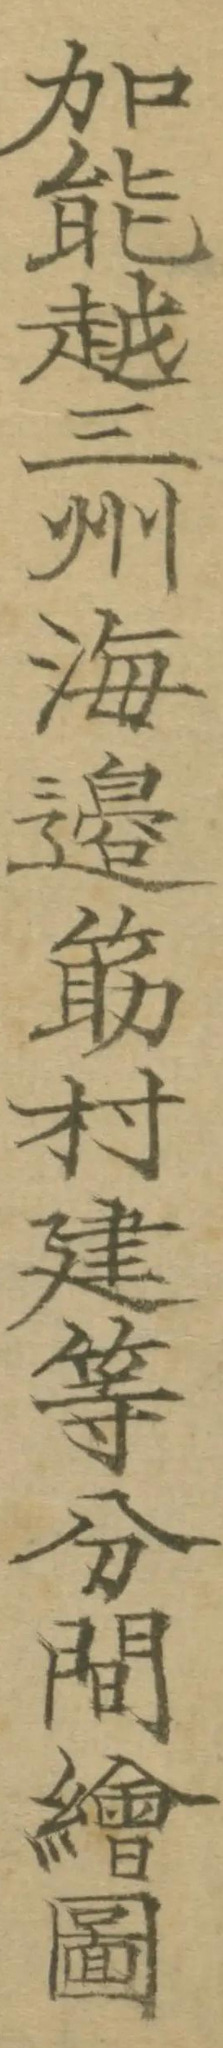加能越三州海邊筋村建等分間繪圖
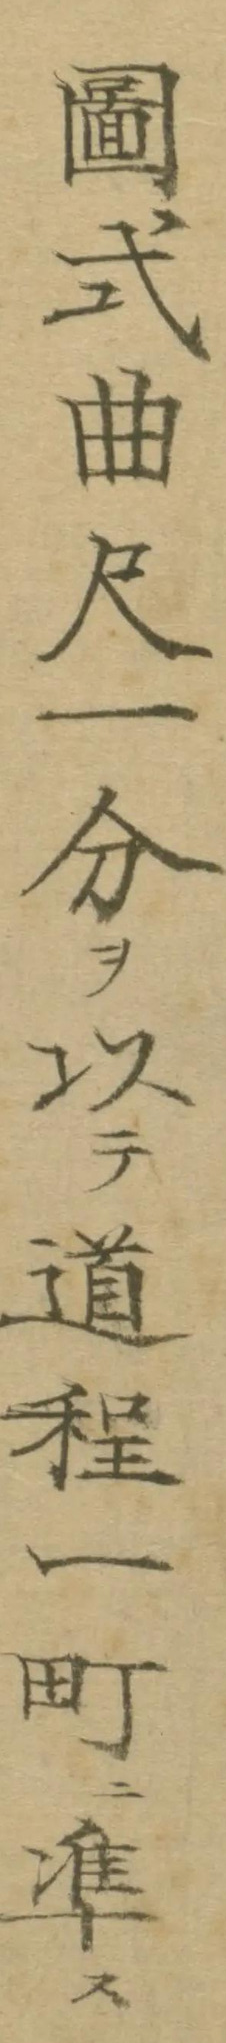圖式曲尺一分ヲ以テ道程一町ニ準ス
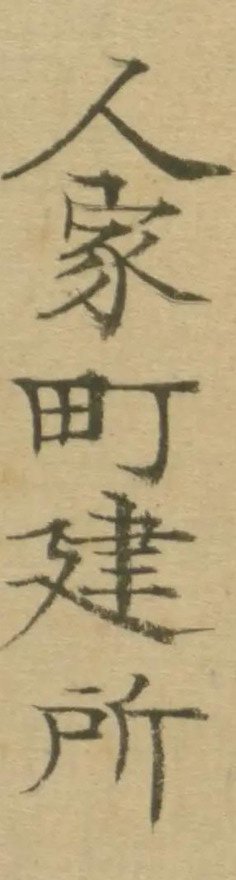人家町建所

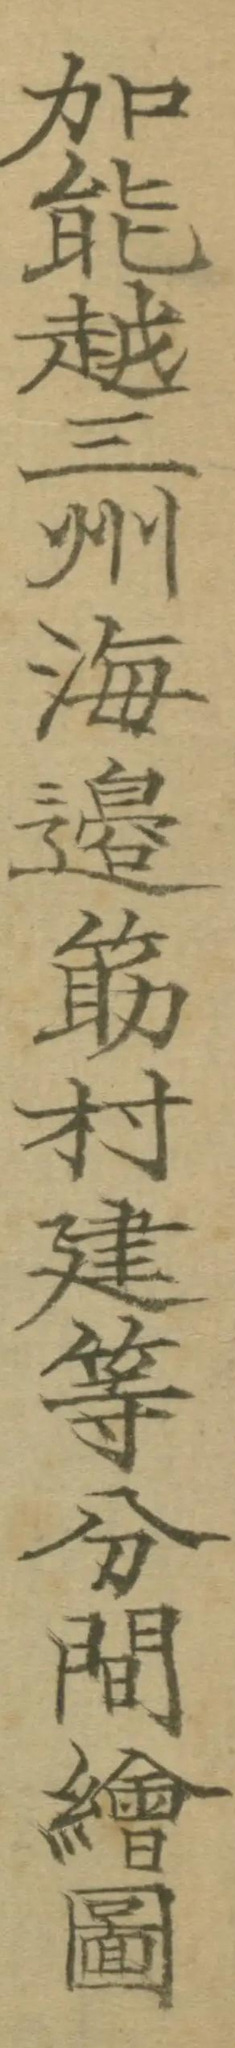加能越三州海邊筋村建等分間繪圖㊞
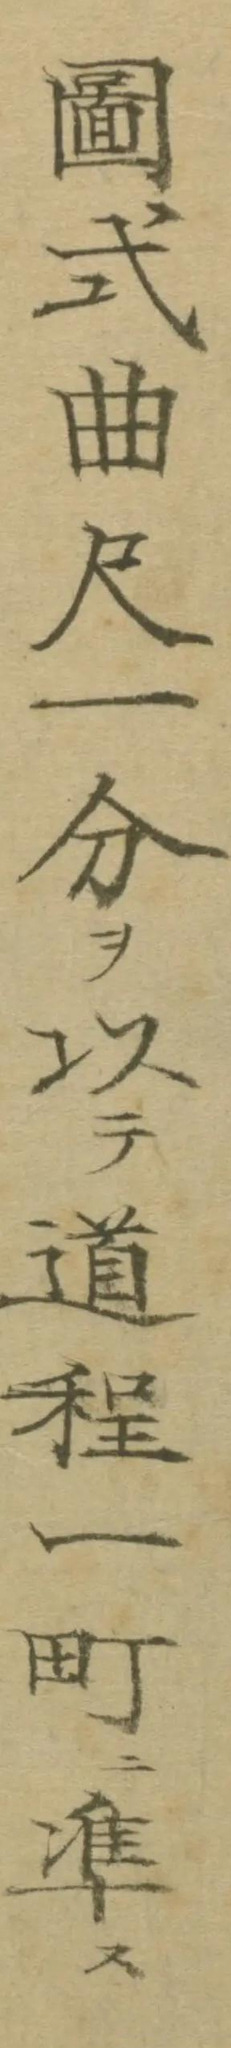圖式曲尺一分ヲ以テ道程一町ニ準ス
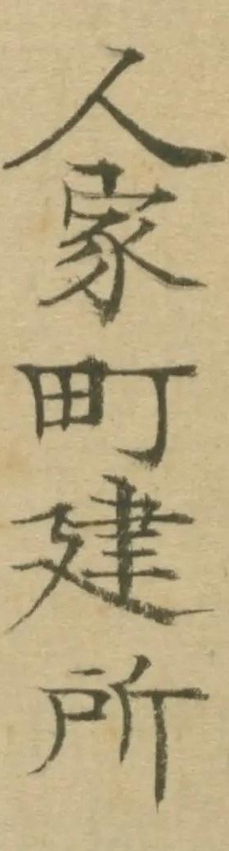人家町建所
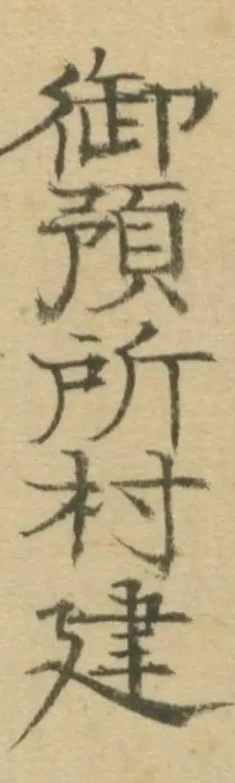御預所村建
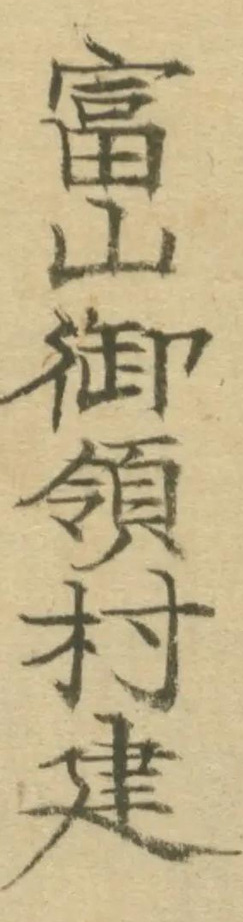富山御領村建
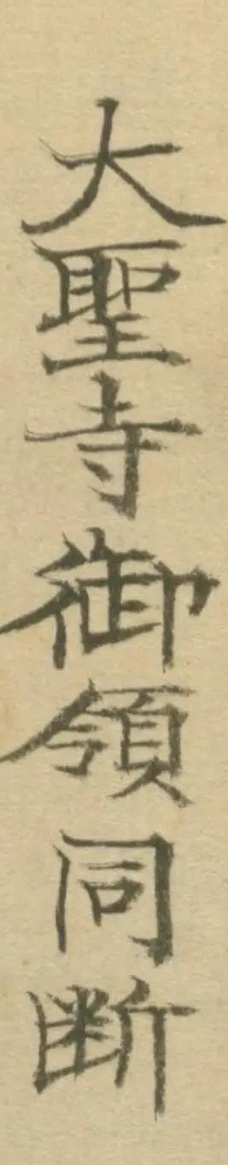大聖寺御領同断
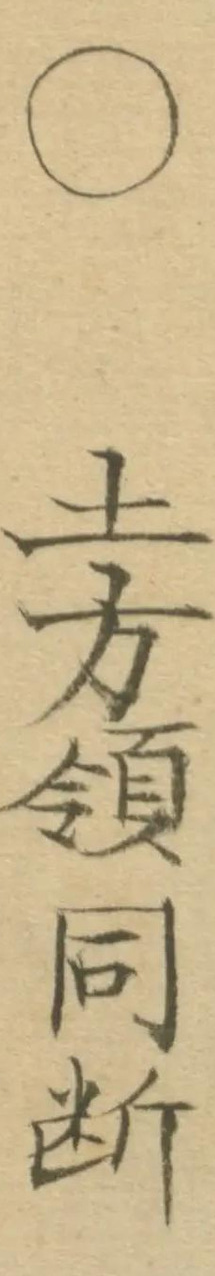土方領同断
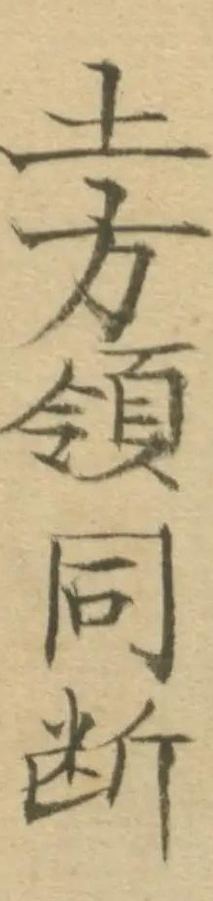土方領同断
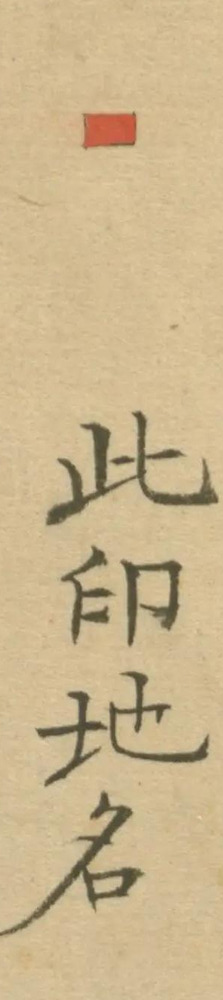此印地名
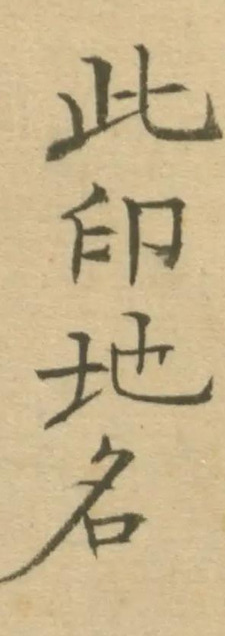此印地名
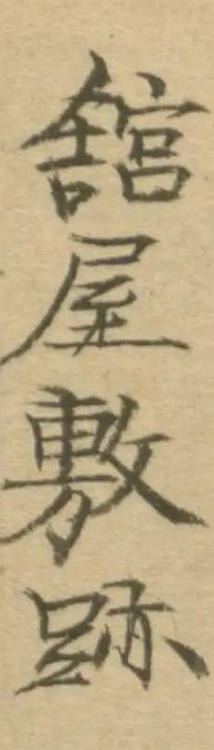舘屋敷跡
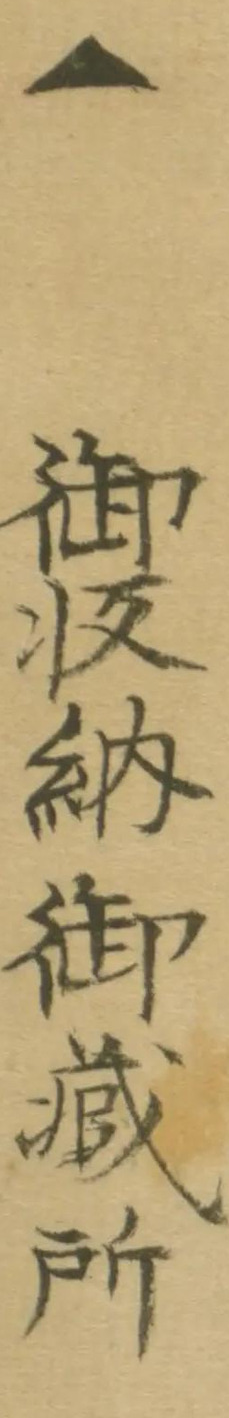御収納御藏所

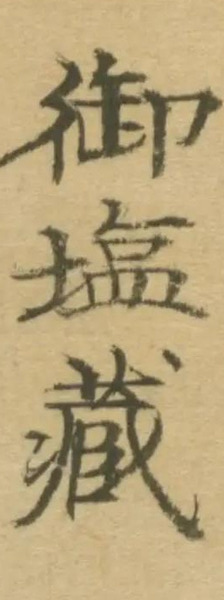御塩蔵
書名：加能越三州海邊筋村建等分間繪圖
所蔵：国立国会図書館 National Diet Library, JAPAN
